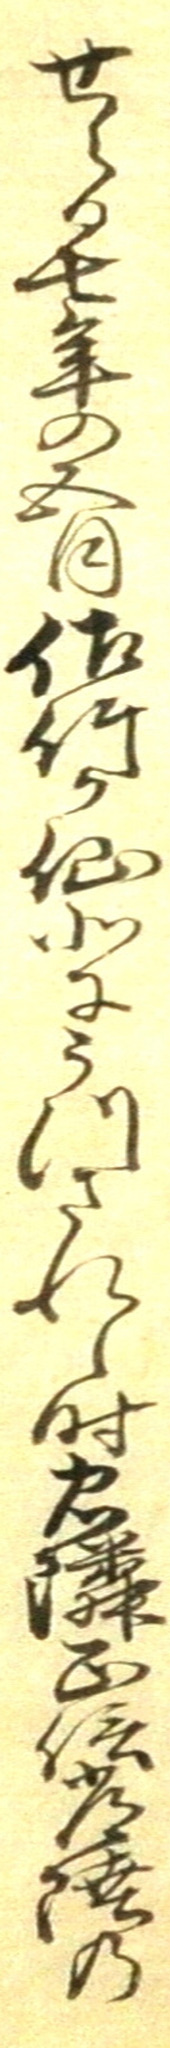せらる七年の五月佐竹か仙北にうつされし時忠隣正信常陸の
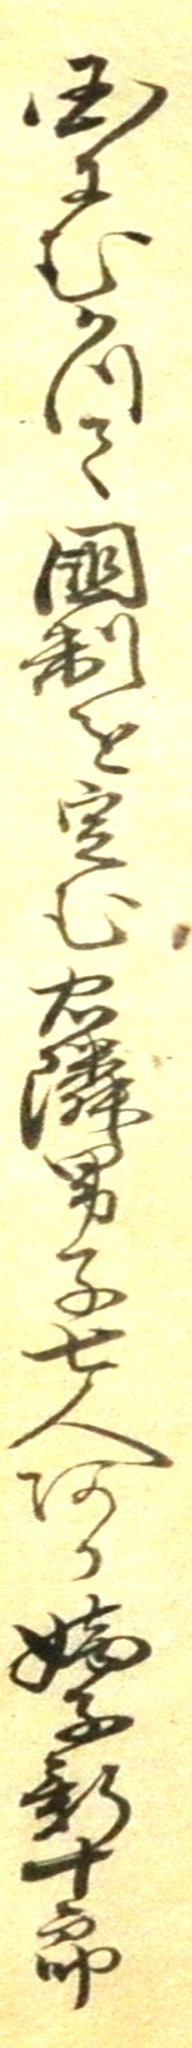国にむかつて国制を定む忠隣男子七人あり嫡子新十郎
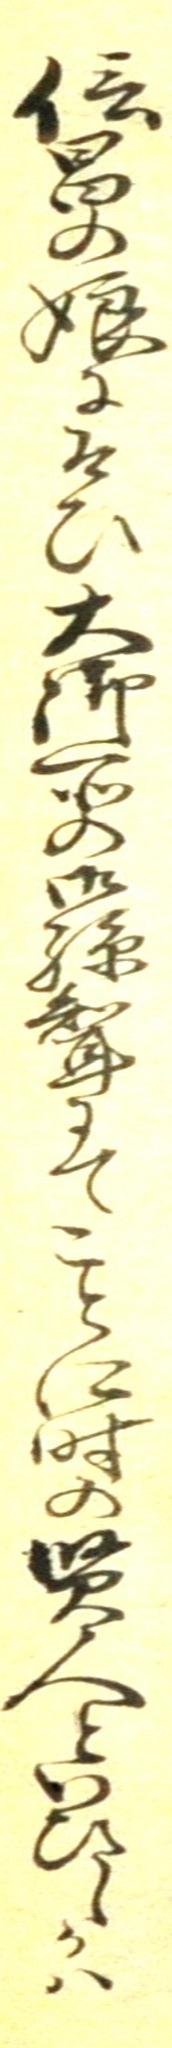信昌の娘にそひ大御所の御孫聟にてことに時の賢人といひしかは
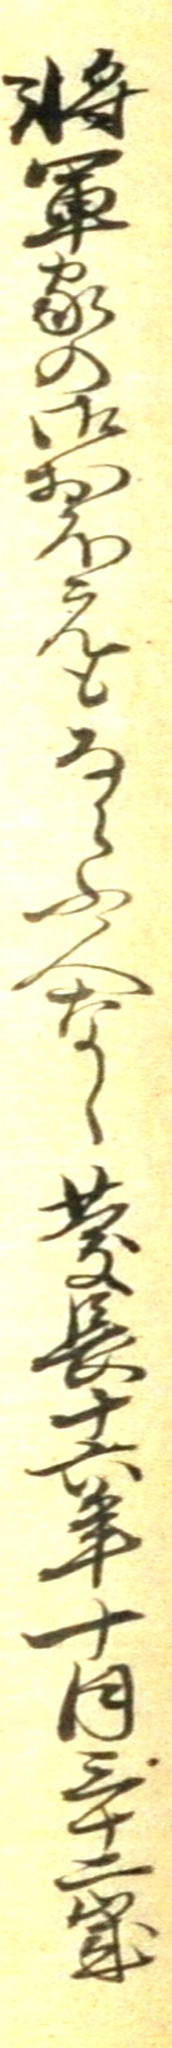将軍家の御おほえもならふ人なし慶長十六年十月三十二歳
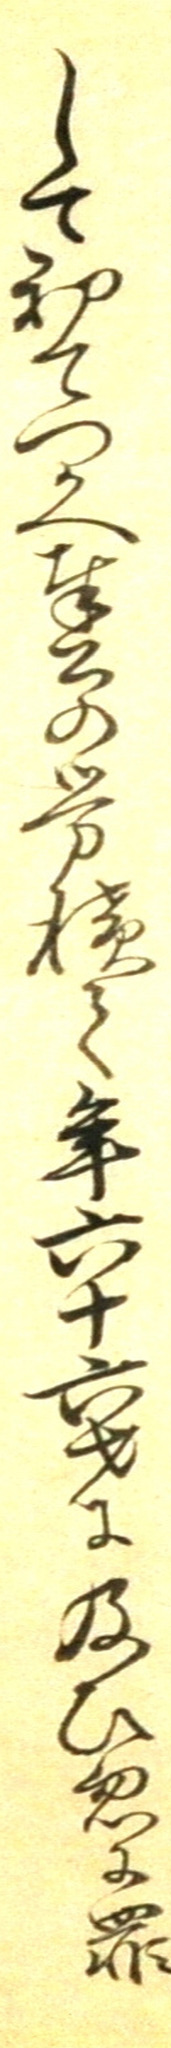して初てつかへ奉公の労積て年六十六才に及ひ忽に罪
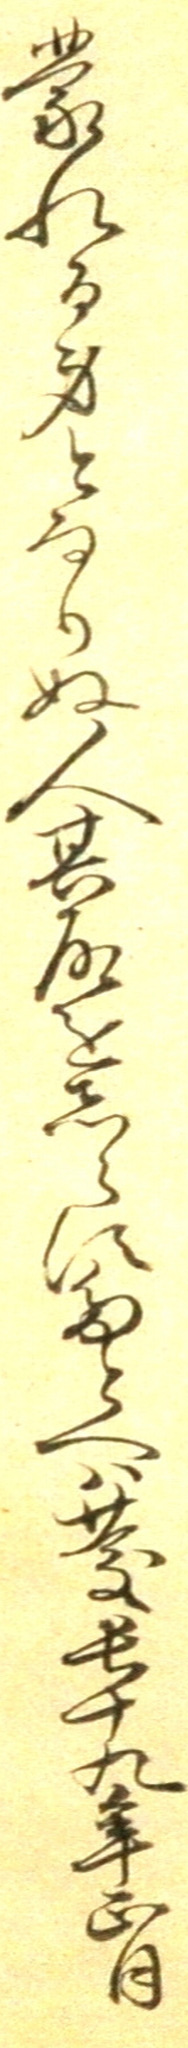蒙れる身となりぬ人其故をしらすたとへは慶長十九年正月
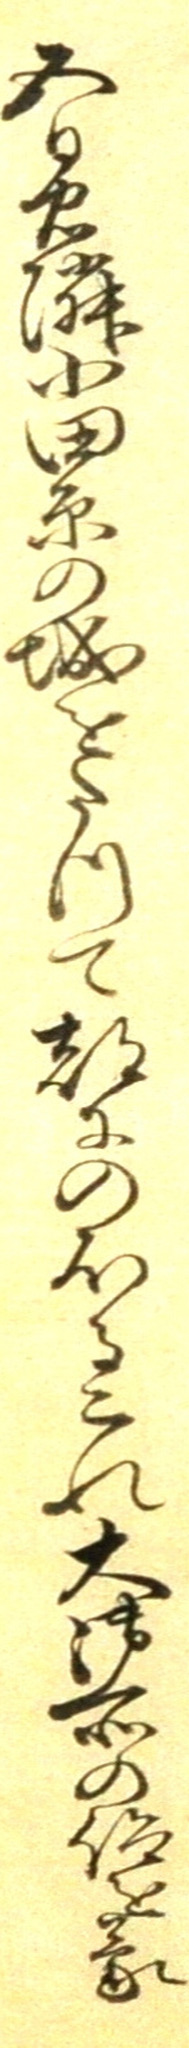五日忠隣小田原の城をたつて都にのほるこれ大御所の仰を蒙
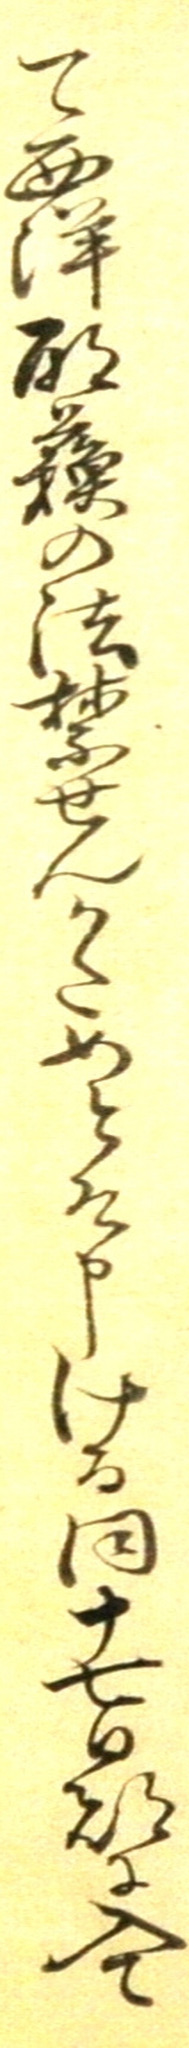て西洋耶蘇の法禁せんかためとそ申ける同十七日都に入て
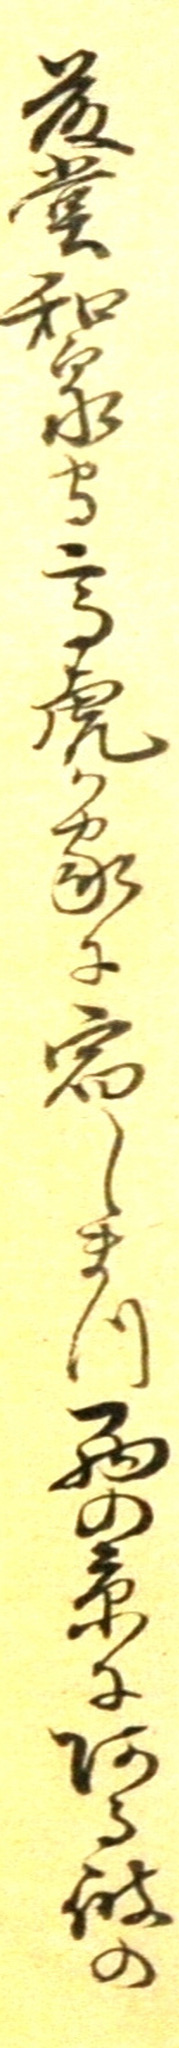藤堂和泉守高虎か家に宿しまつ西の京にある彼の

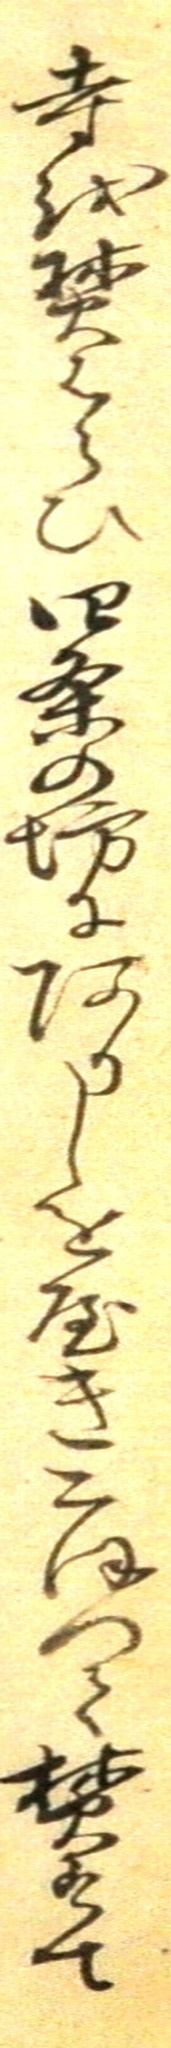寺を焚はらひ四条の坊にありしをやきこほつて焚すて
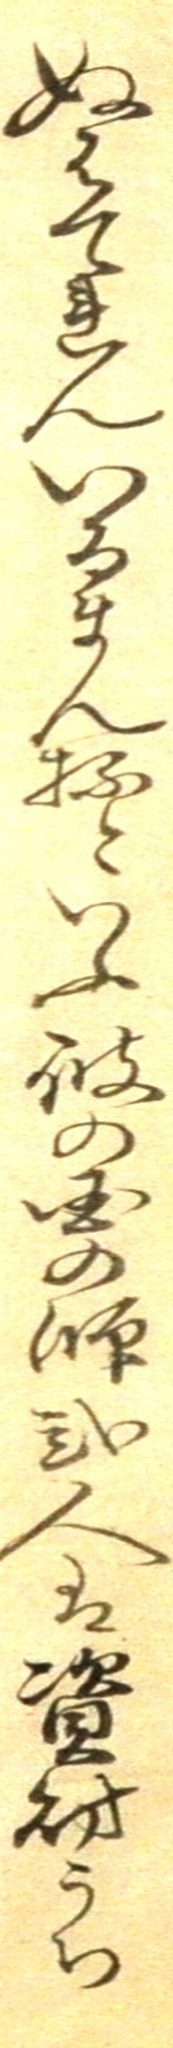ぬはてれんいるまん抔といふ彼の国の師弐人は資財うち
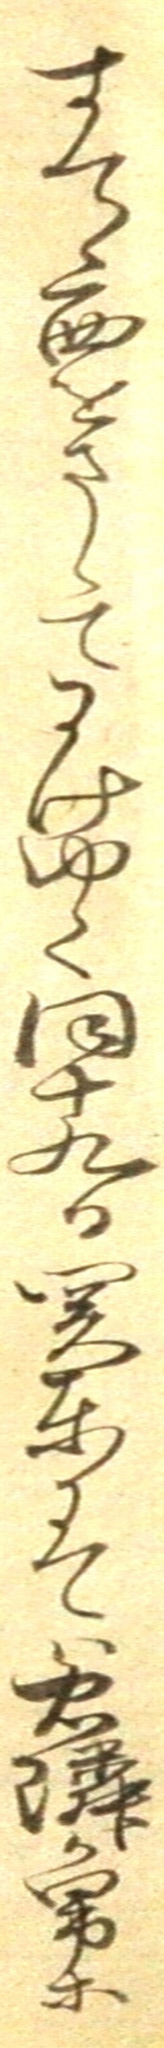すてゝ西をさしてにけゆく同十九日関東にては忠隣か男等
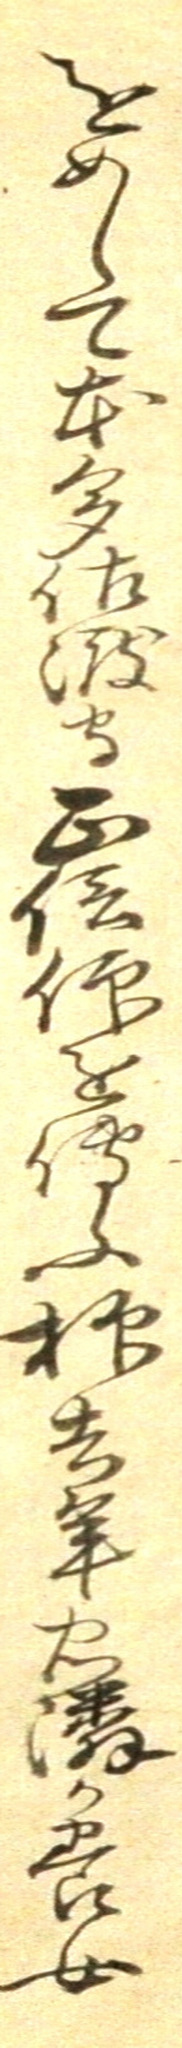をめして本多佐渡守正信仰を伝ふ抑去年忠隣か養女
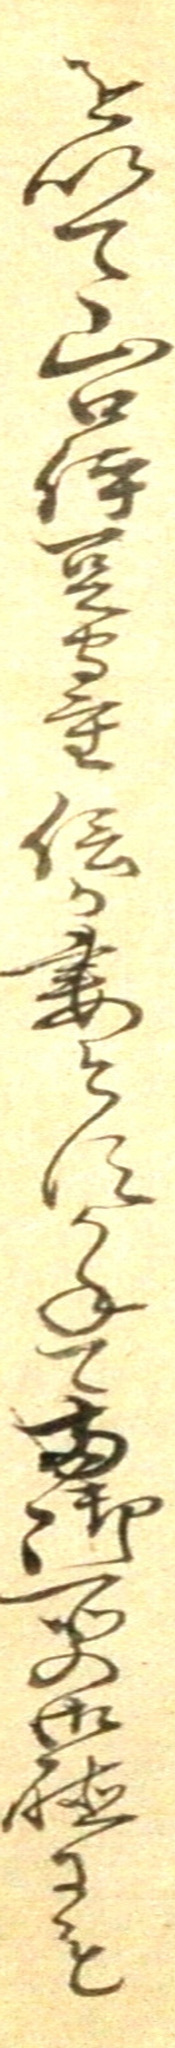を以て山口伊豆守重信か妻とすかねて両御所の御聴にも
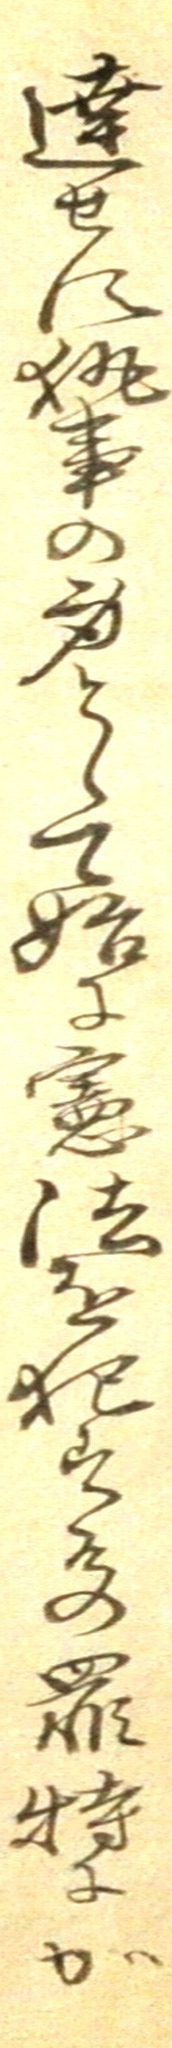達せす執事の身として始に憲法を犯すその罪特にか
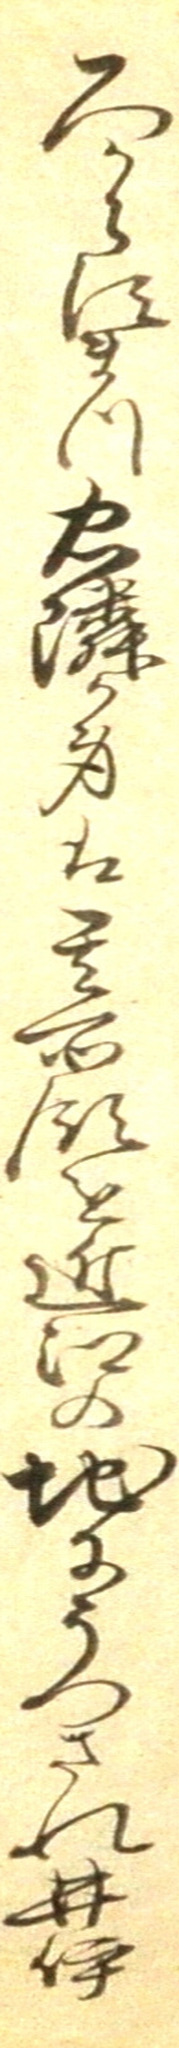ろからすまつ忠隣か身は其所領を近江の地にうつされ井伊
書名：藩翰譜（四・中）
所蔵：伊那市立高遠町図書館・合同会社AMANE
